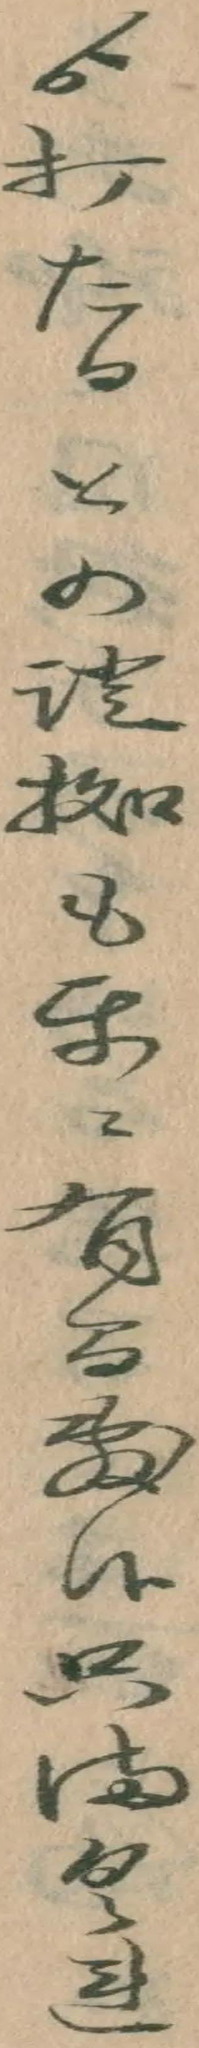ゟ打たるとの證拠も互に有間敷候只備具連
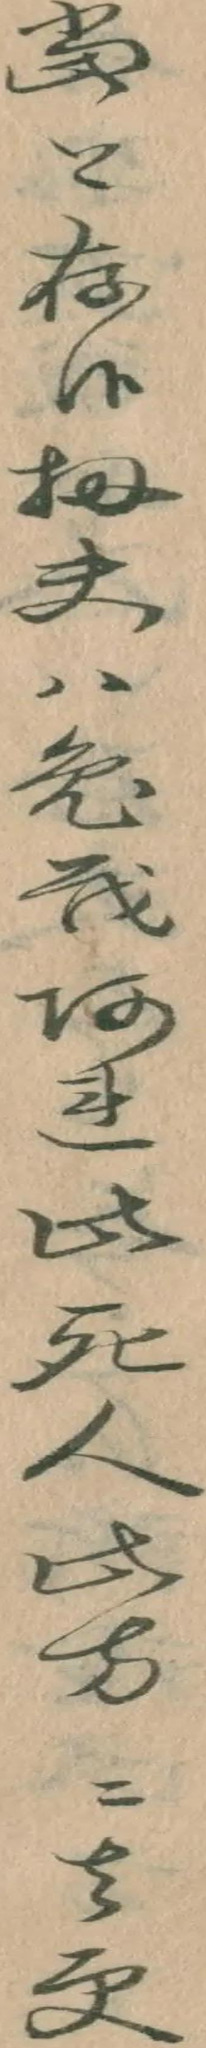当と存候扨夫は兎茂阿連此死人此方に者更
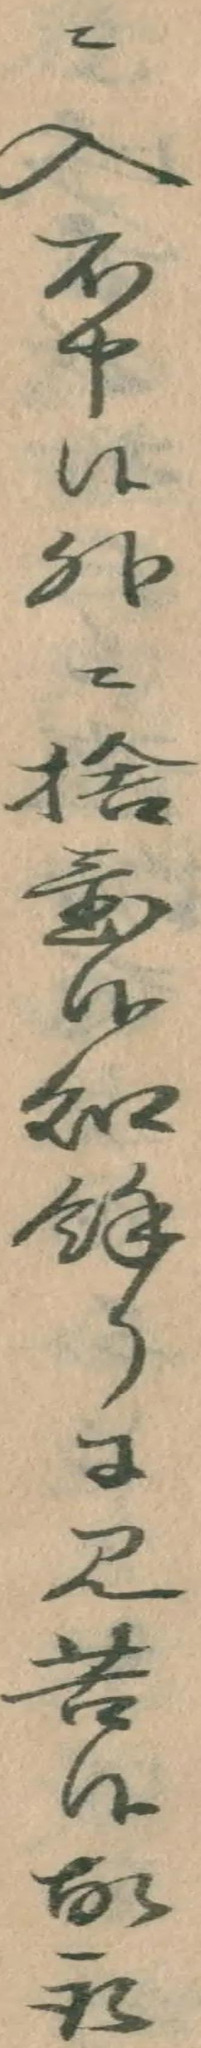に入不申候外に捨置候処余り尓見苦候故取
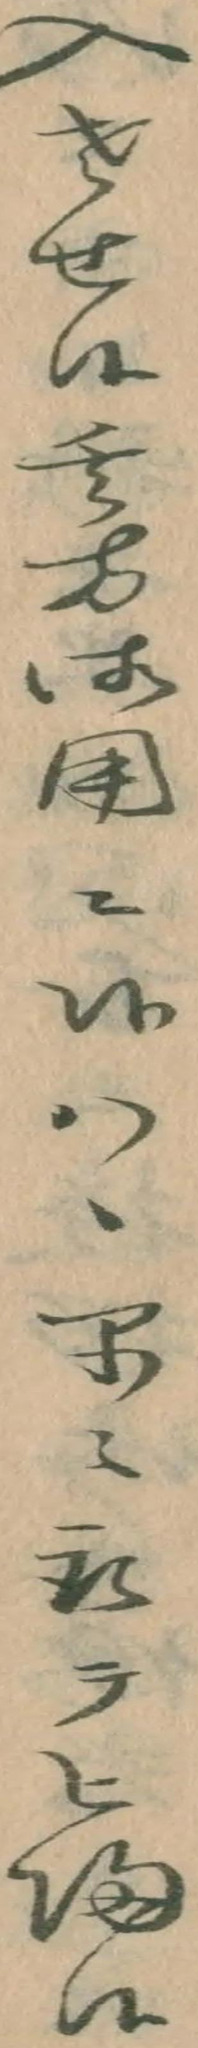入させ候其方御用に候はゝ早々取て被帰候

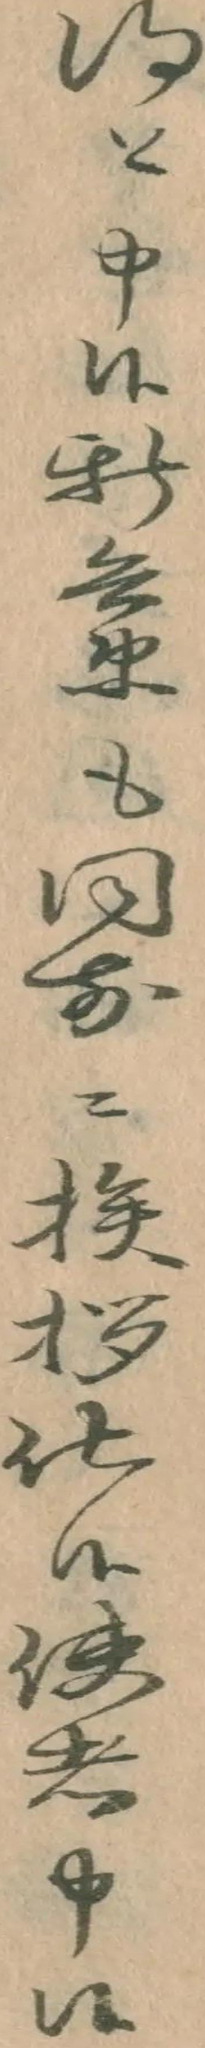得と申候新兵衛も同前に挨拶仕候使者申候
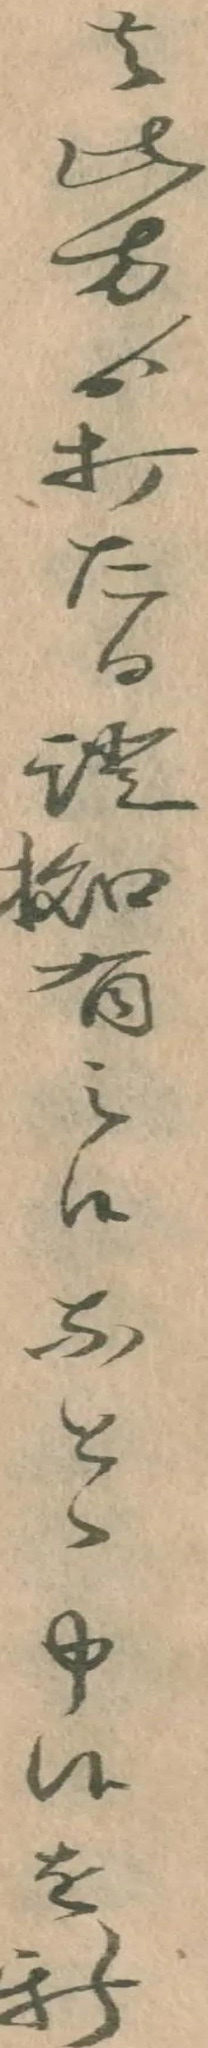者此方ゟ打たる證拠有之候なとゝ申候を新
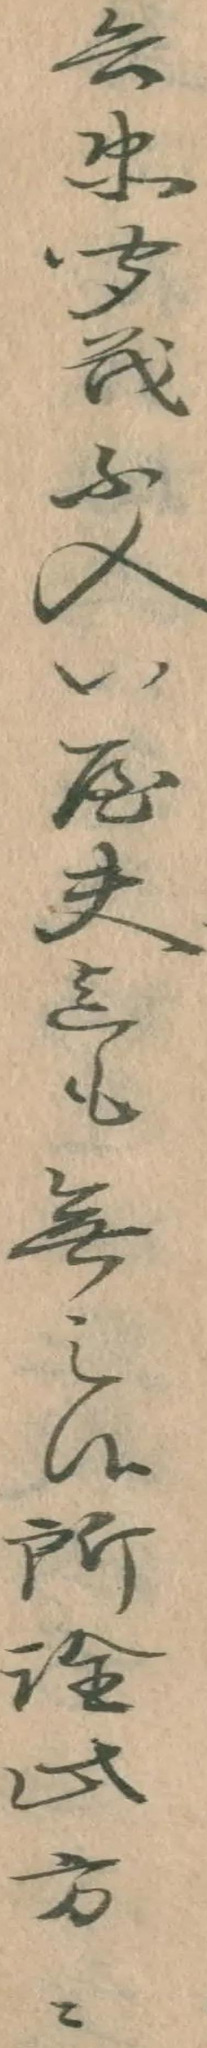兵衛聞茂ふ入い屋夫迄も無之候所詮此方に
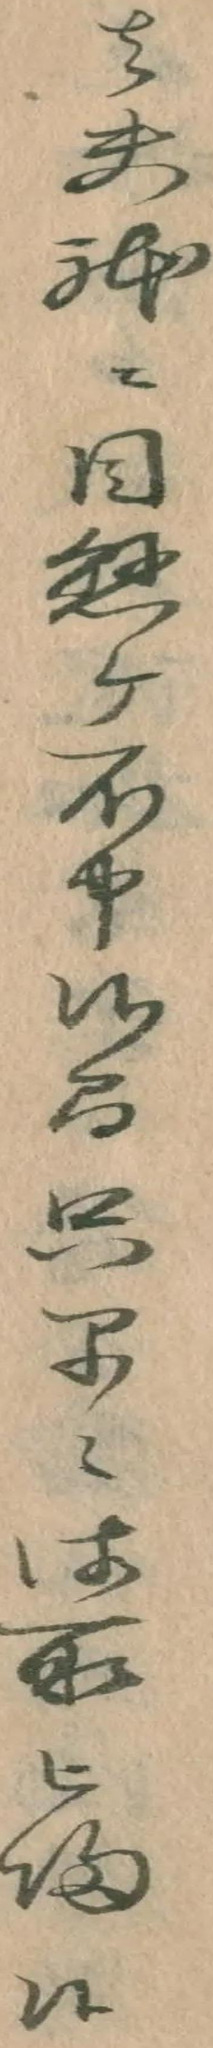者夫躰に目懸け不申候間只早々御取被帰候
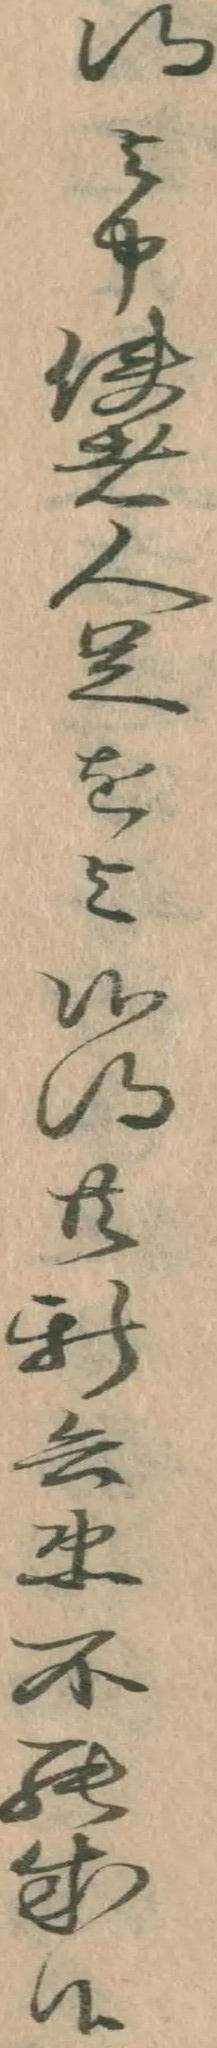得与申使者人足を与候得共新兵衛不罷成候
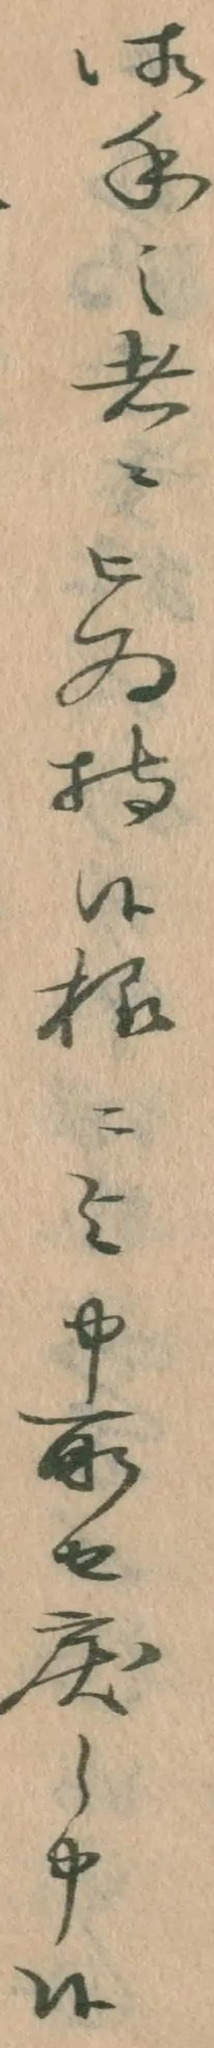御手之者に被ゐ持候様に与申取せ戻し申候
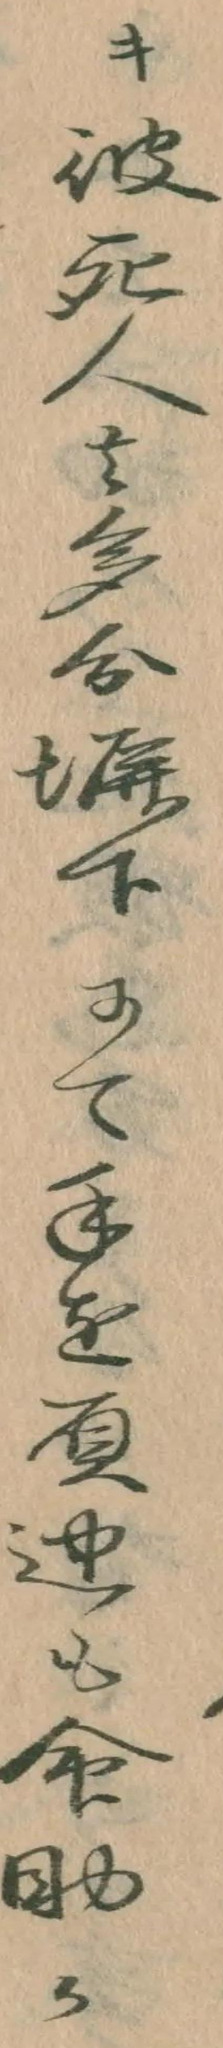き彼死人者多分塀下尓て手を負迚も命助か
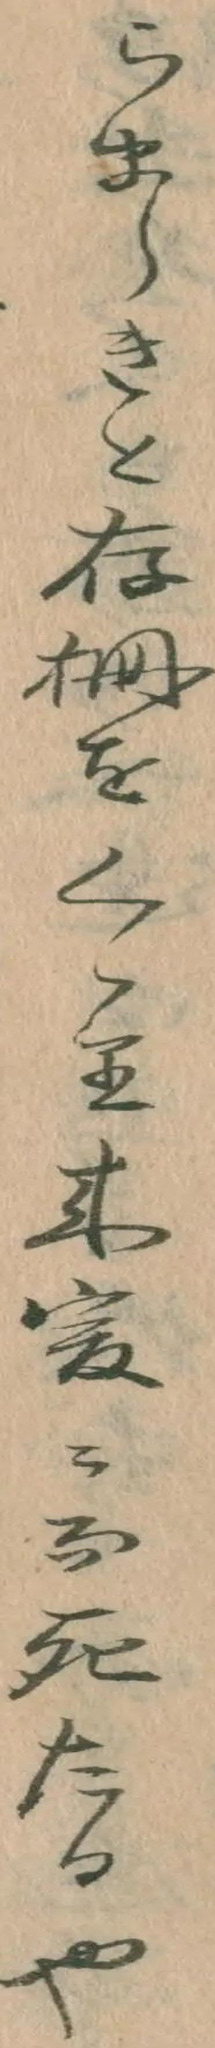らましきと存柵をくゝ里来爰に而死たる也
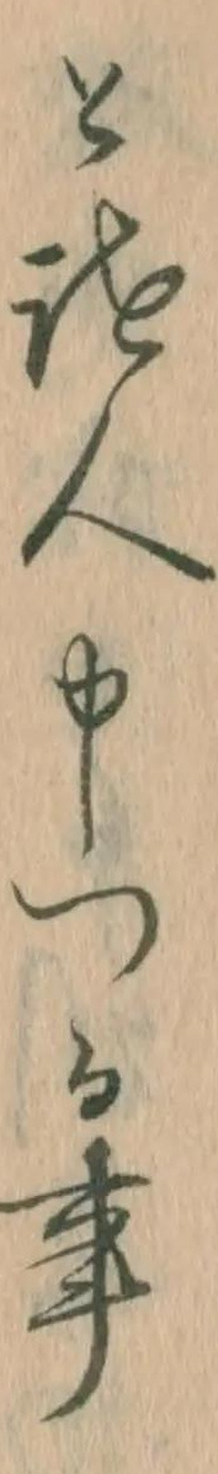と諸人申つる事
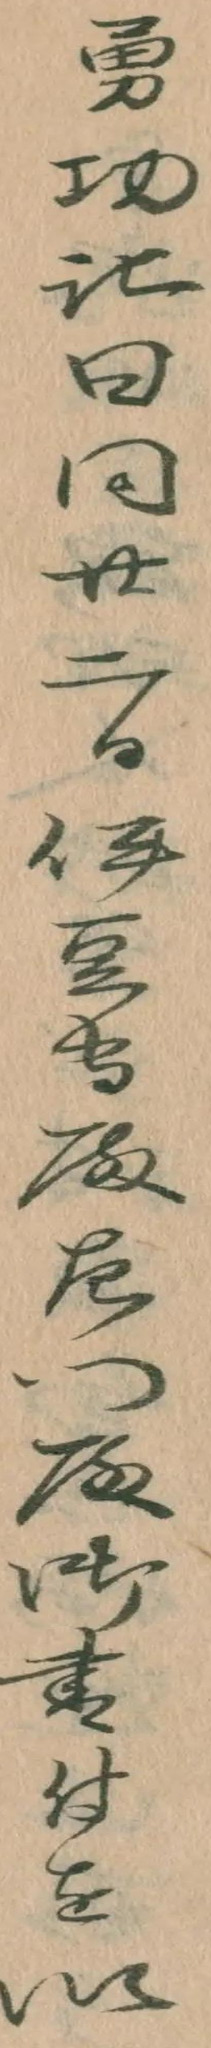勇功記曰同廿二日伊豆守殿左門殿御書付を以
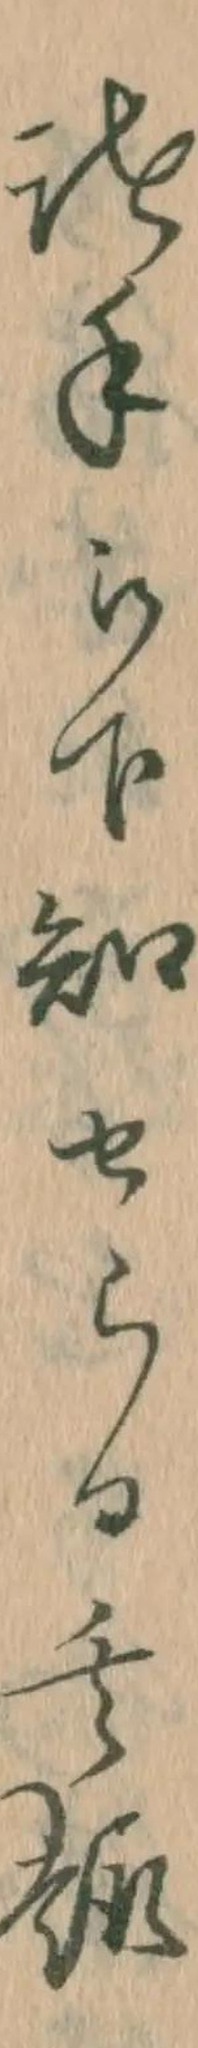諸手江下知せらる其趣
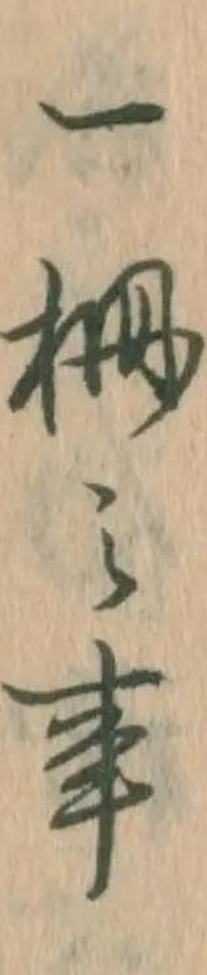一柵之事
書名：切支丹御退治記 49巻. [7]
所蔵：国立国会図書館 National Diet Library, JAPAN
